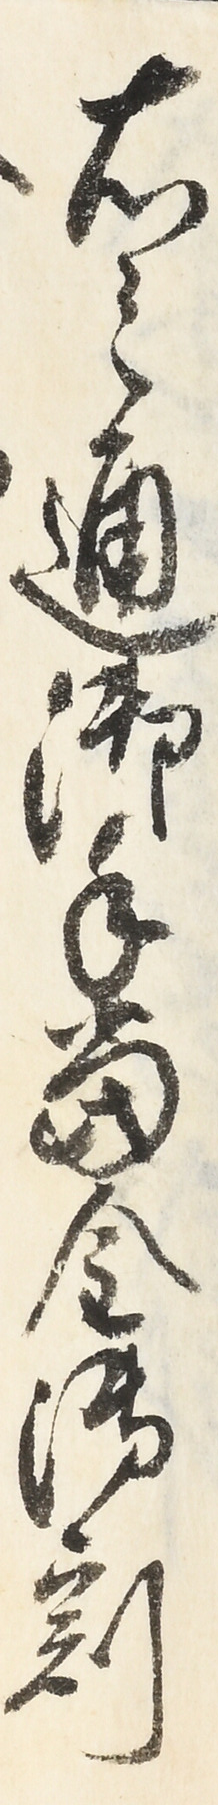右之通御手当金御割
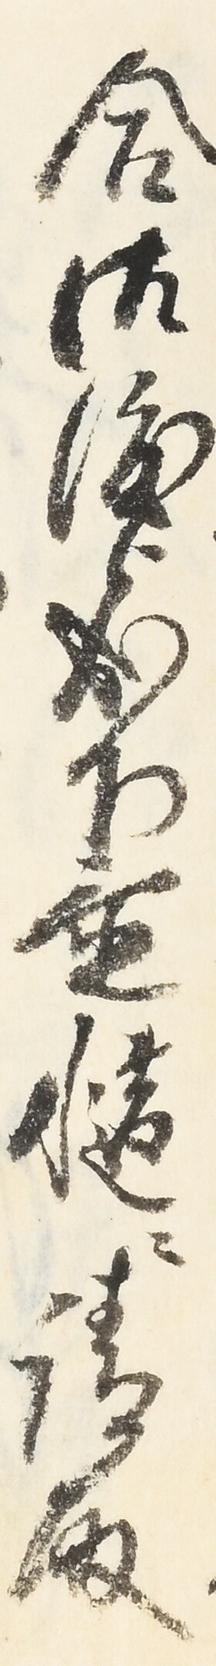合御渡被成下置慥請取
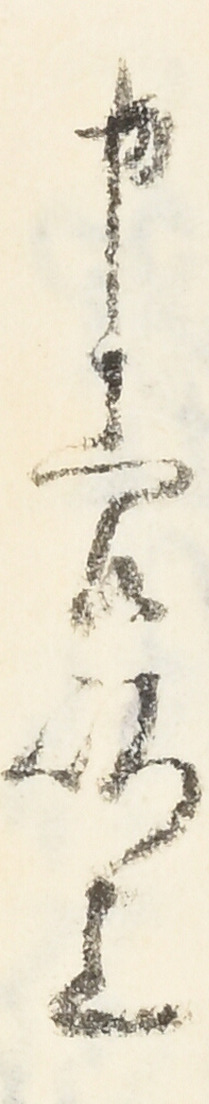申上候以上
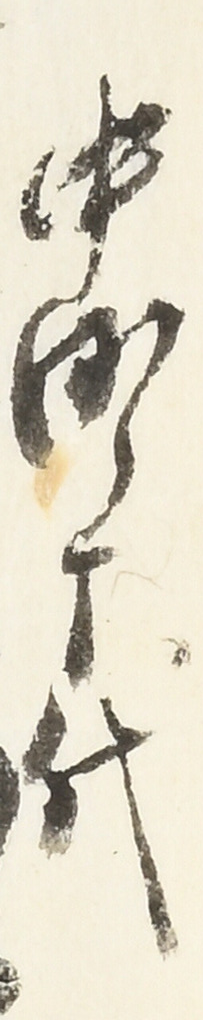中町丁代
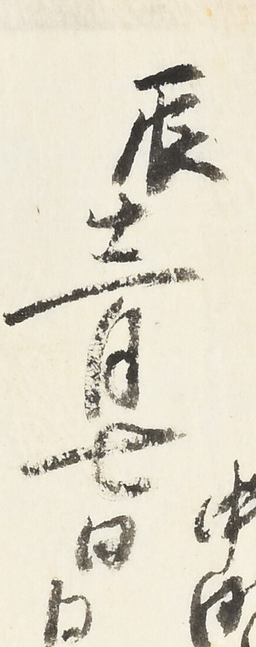十二月七日同断
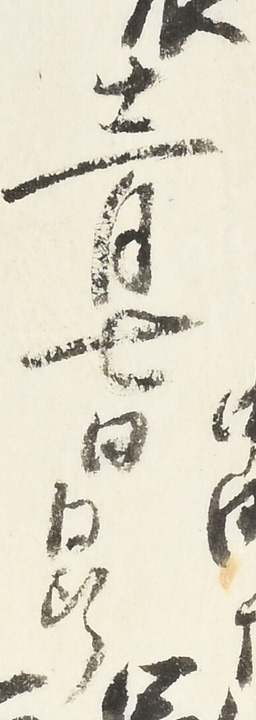十二月七日同断
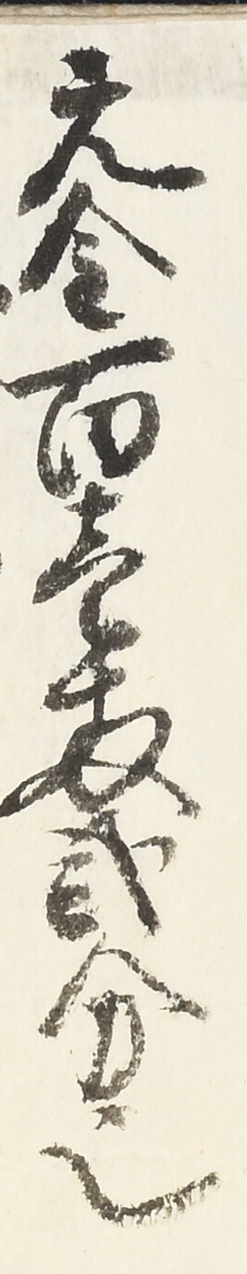元金百壱両弐分也
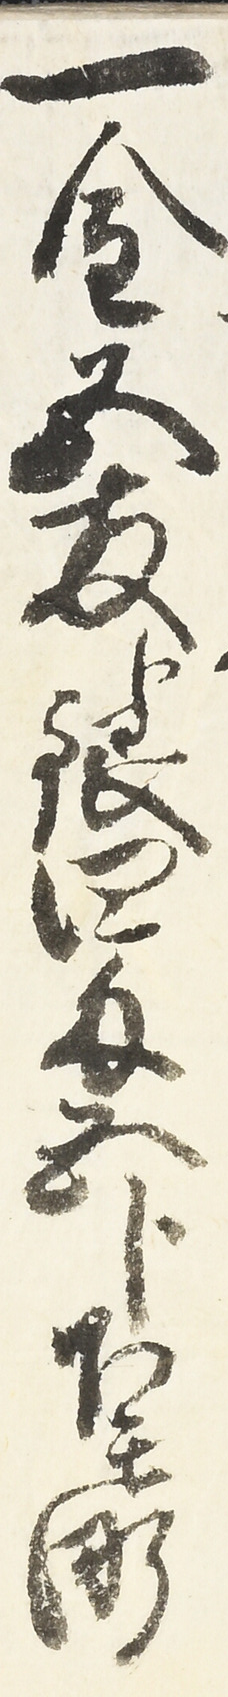一金五両ト銀四匁五分下モ町
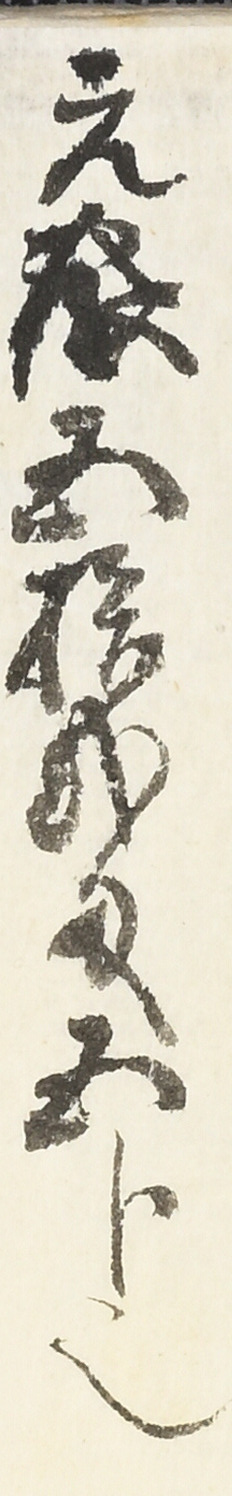元金五拾弐匁五分也
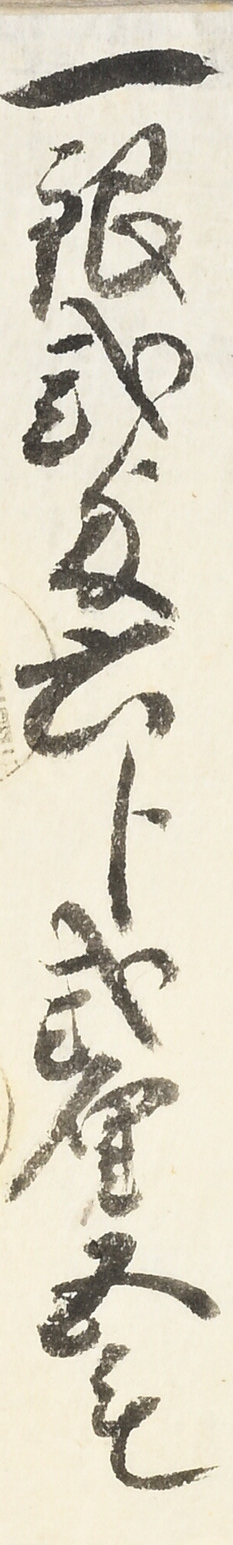一銀弐匁六分弐厘五毛
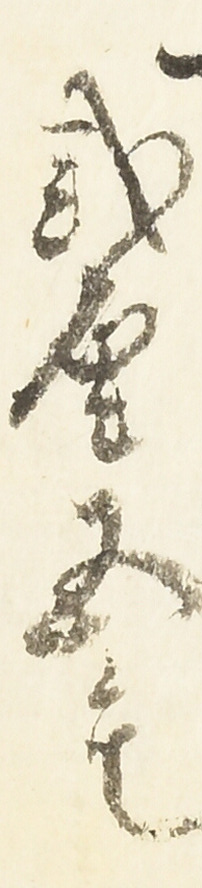弐厘五毛
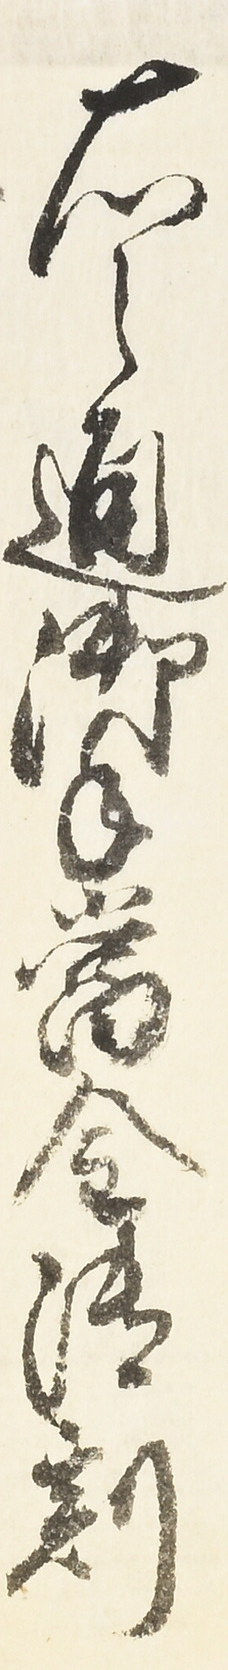右之通御手当金御割
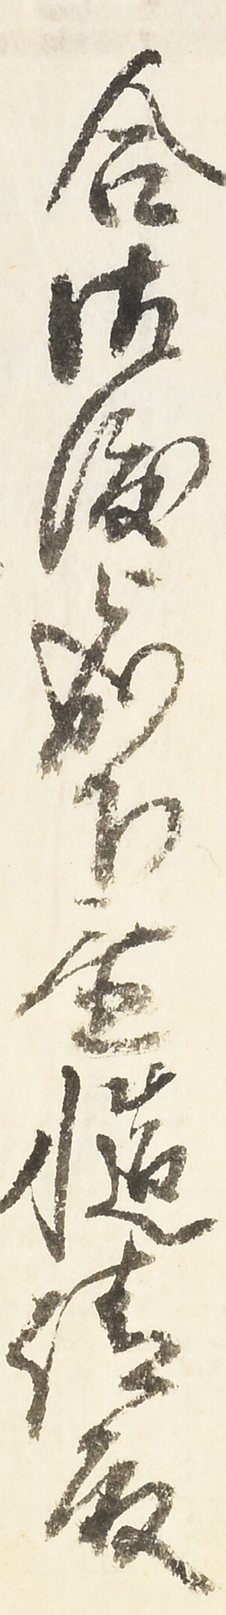合御渡被成下置慥請取
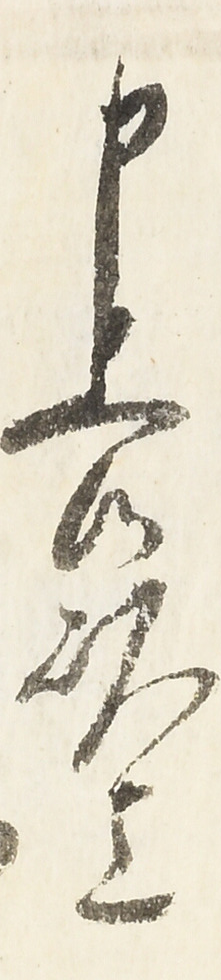申上候以上
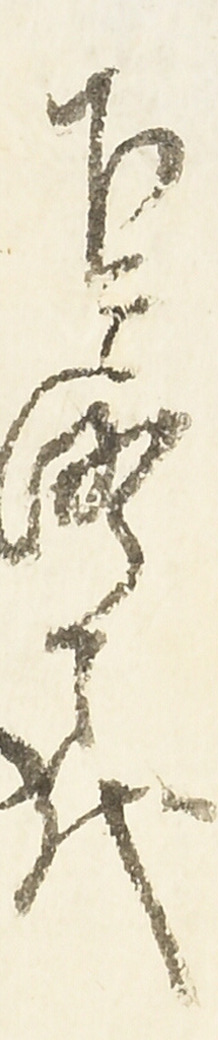下モ町丁代
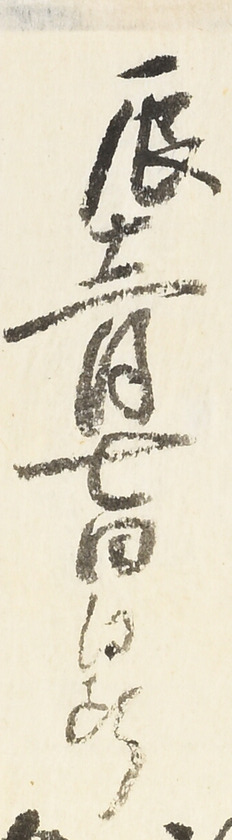十二月七日同断
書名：御才覚金御利足割渡扣帳
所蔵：伊那市立高遠町図書館・合同会社AMANE
